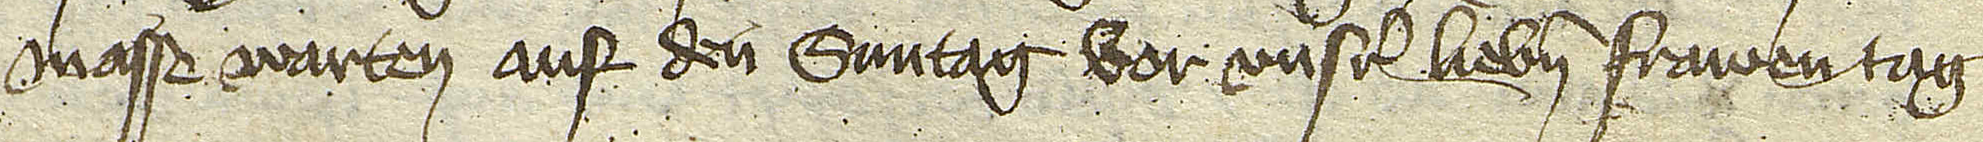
maſſe warten auf den Suntag vor vnſr* liebn* frawen tag
